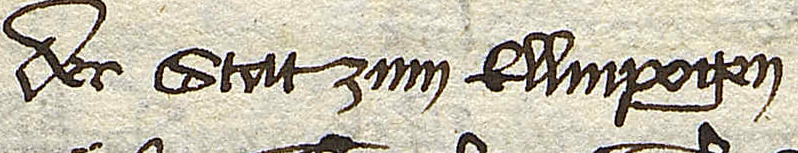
Der Stat ʒum Ellmpogen
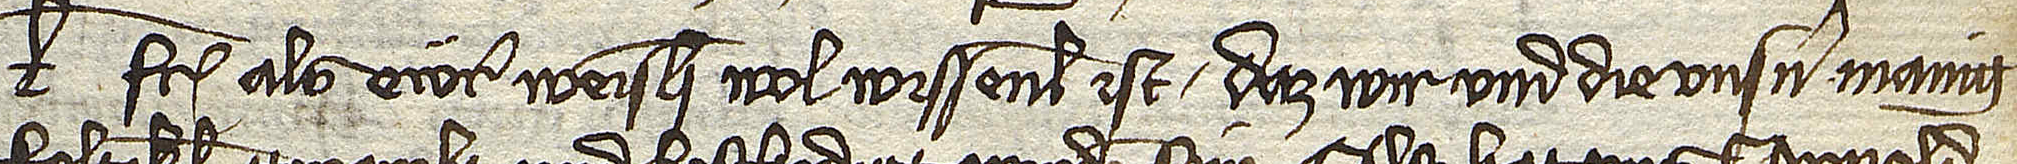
L* fr* als eẅr* weiſh* wol wiſſenl* iſt / daʒ wir vnd die vnſn* . manig
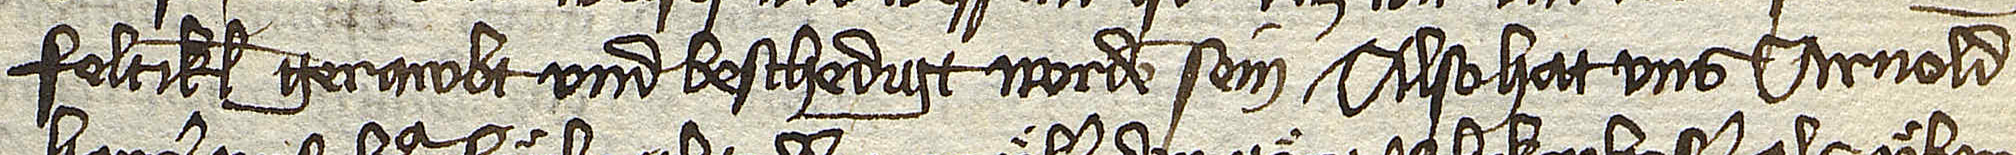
feltikl* gerawbt vnd beſchedigt worde* ſein / Alſo hat vns Arnold
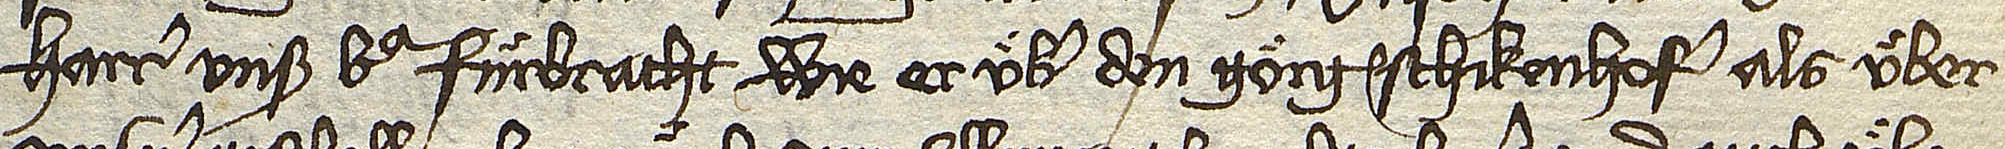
Harr* vnſ* b* fürbracht Wie er v̈b* den görg* ſchikenhof* als v̈ber
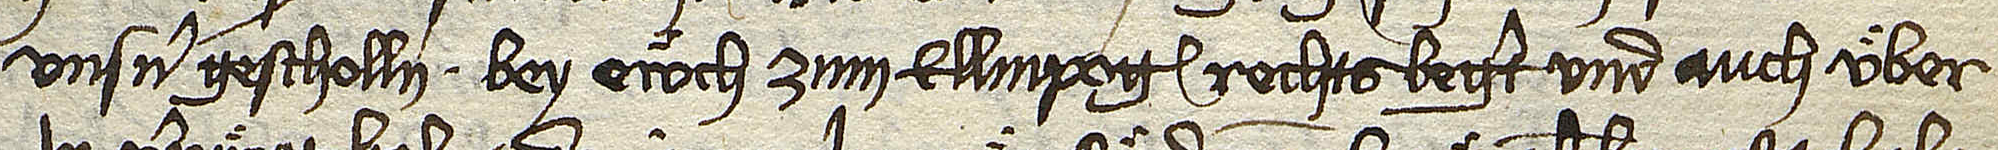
vnſn* geſcholln . bey eẅch ʒum Ellmpog* rechts beg*t vnd auch v̈ber
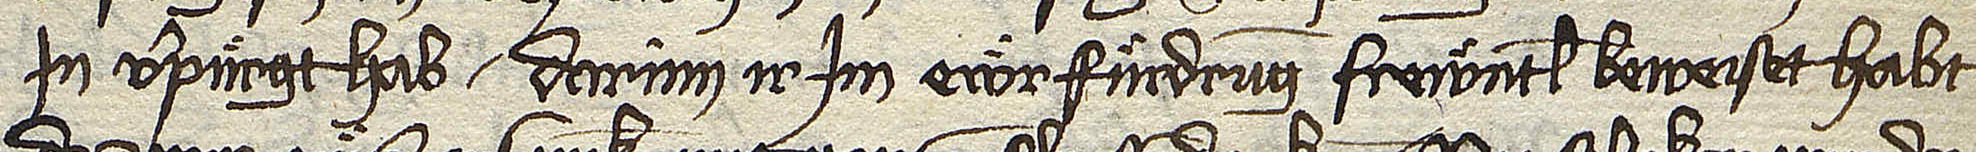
In v*pürgt hab / Darinn ir Im eẅr fürdru*g freẅntl* beweiſet habt
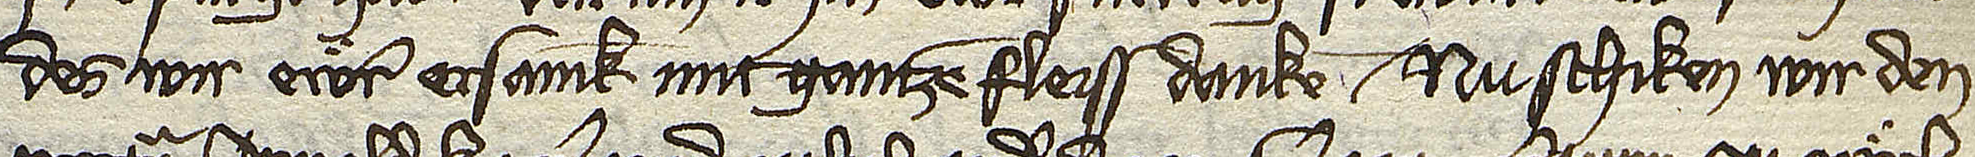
des wir eẅr* erſamk* mit gancʒe* fleiſſ danke* / Nu ſchiken wir den
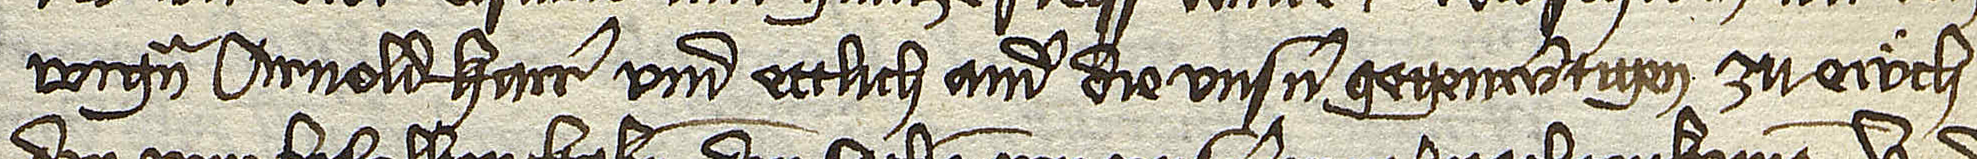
vorgn* Arnold Harr* vnd ettlich and* die vnſn* gegenw*tigen ʒu eẅch
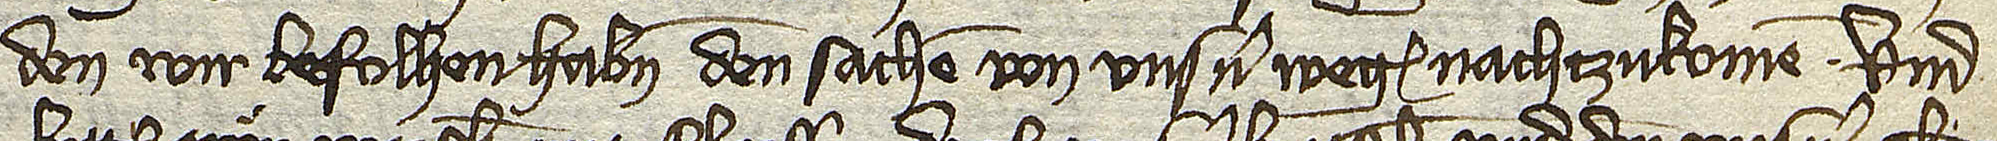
den wir befolhen habn* den ſache* von vnſn* weg* nachʒukome* . Vnd
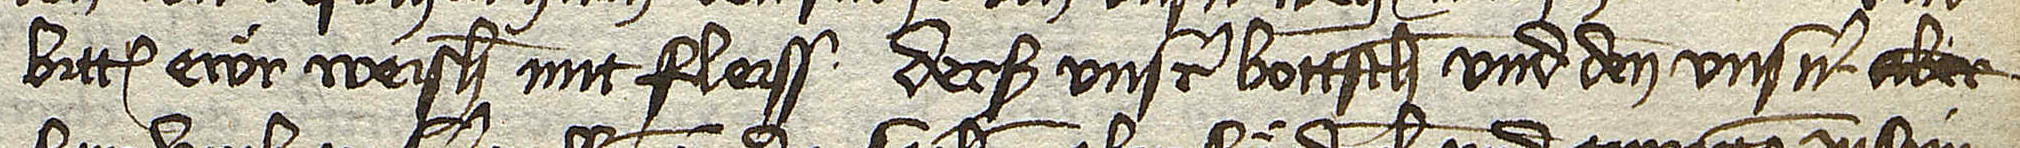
bitt* eẅr weiſh* mit fleiſſ . derſ* vnſr* bottſch* vnd den vnſn* aber
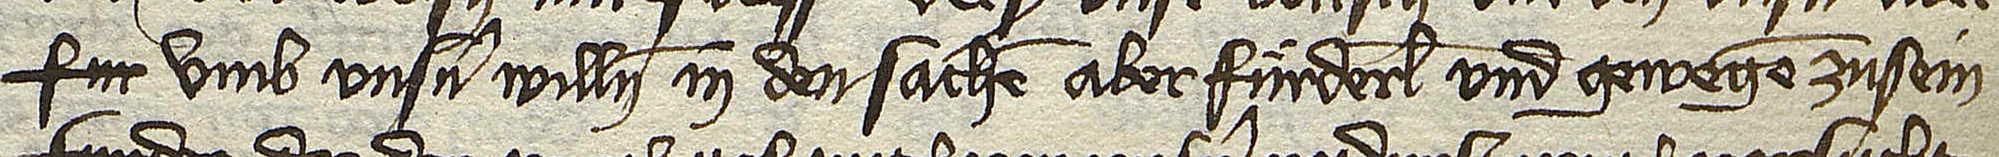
fur vmb vnſn* willn* in den ſache* aber fürderl* vnd gewege ʒuſein
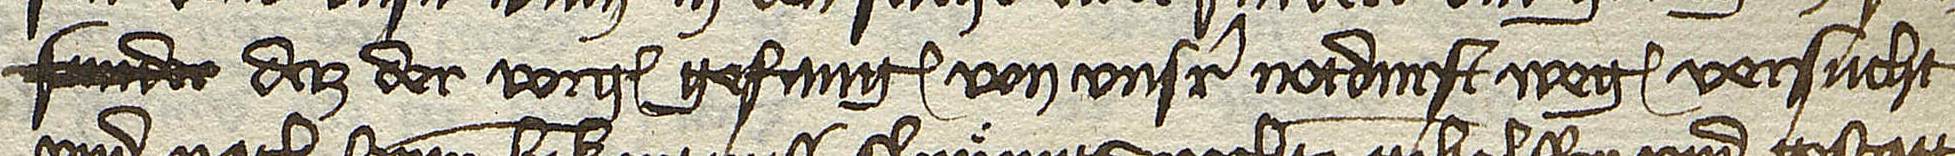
ſunder daʒ der vorg* gefang* von vnſr* notdurft weg* verſucht
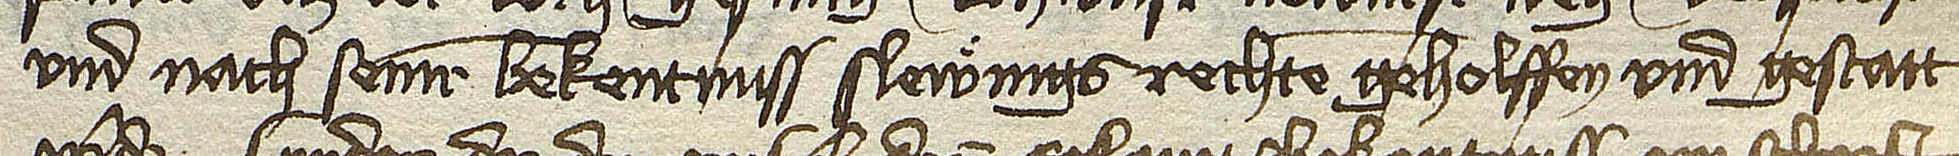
vnd nach ſeinr bekentnuſſ ſleẅnigs rechte* geholffen vnd geſtatt
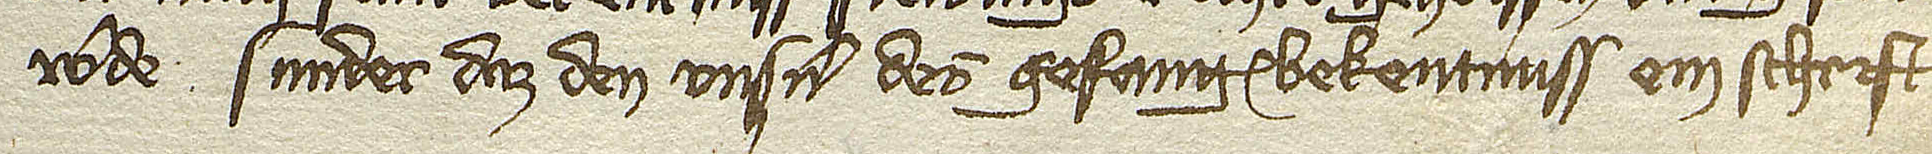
w*de ſunder daʒ den vnſn* des gefang* bekentnuſſ ein ſchrift
